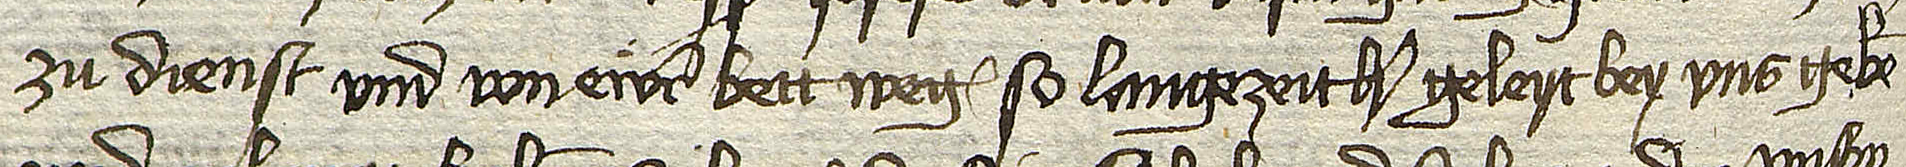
ʒu dienſt vnd von eẅr* bett weg* ſo langeʒeit h* geleyt bey vns gebe*
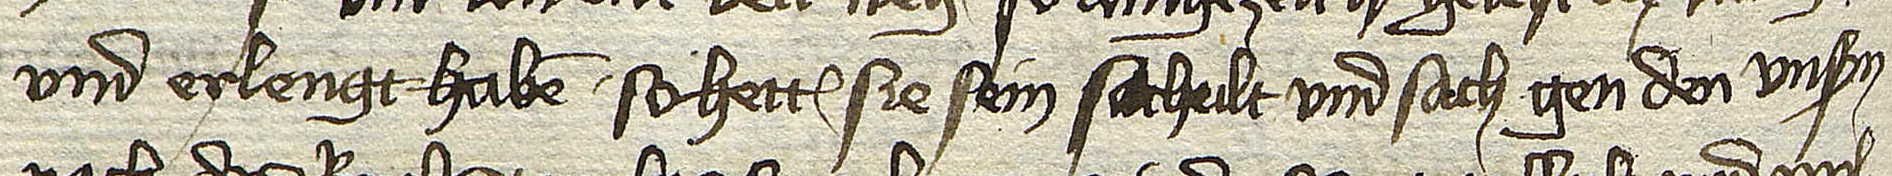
vnd erlengt habe* / ſo hett* ſie ſein ſacheilt vnd ſach gen den vnſ*n
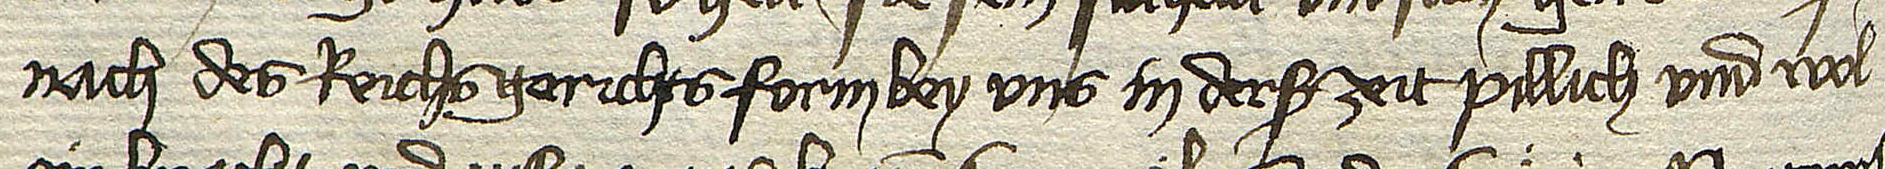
nach des Reichs gerichts form bey vns in derſ* ʒeit pillich vnd wol
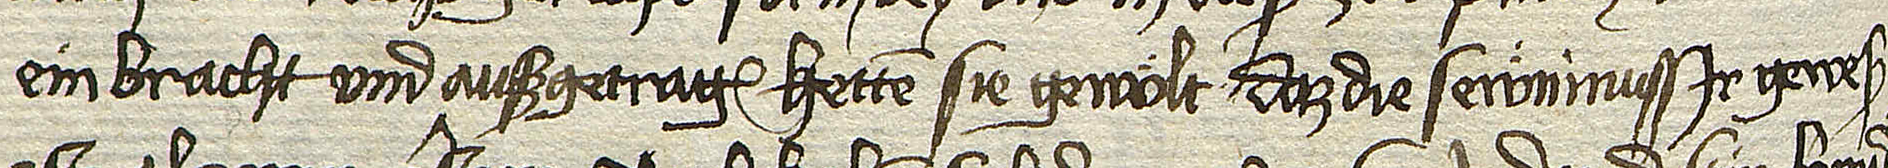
ein bracht vnd auſʒgetrag* hette* ſie gewölt daʒ die ſeẅmnuſſ Ir geweſ*
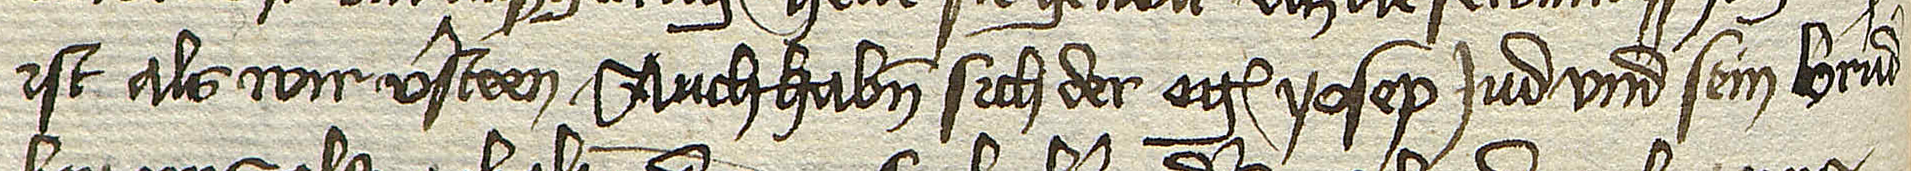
iſt als wir v*ſteen / Auch habn* ſich der eg* Yoſep Iud vnd ſein brud*
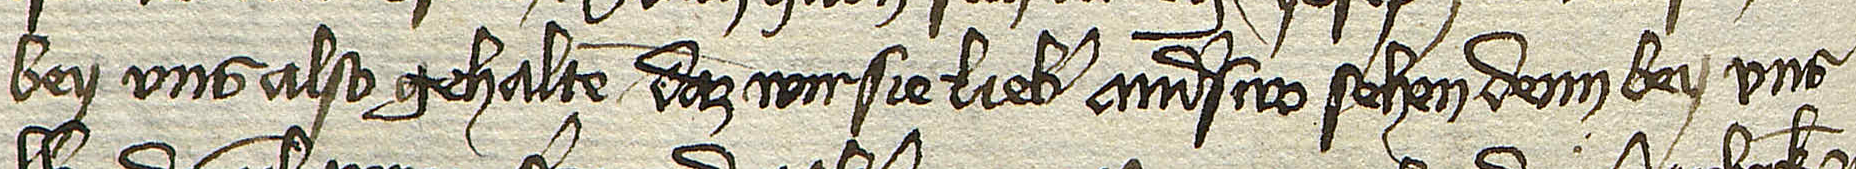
bey vns alſo gehalte* / daʒ wir ſie lieb* and*ſwo ſehen denn bey vns
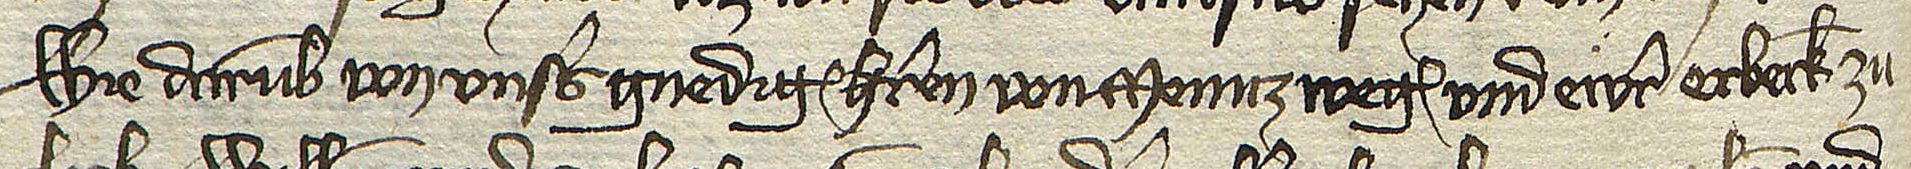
Wie darub* von vnſ*s gnedig* h*ren von Meincʒ weg* vnd eẅr* erberk* ʒu
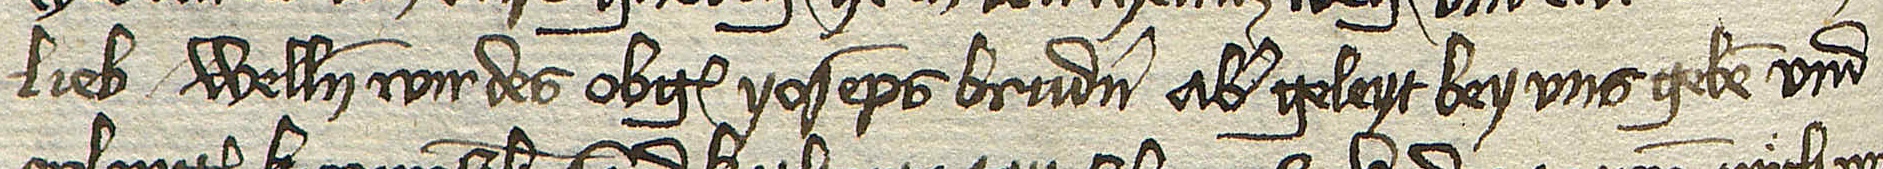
lieb / Welln* wir des obg* Yoſeps brudn* ab* geleyt bey vns gebe* vnd
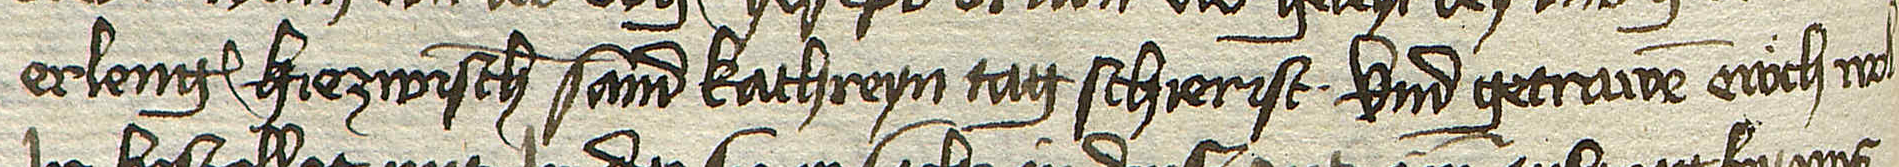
erleng* hieʒwiſch* ſand kathreyn tag ſchieriſt . Vnd getrawe* eẅch wol
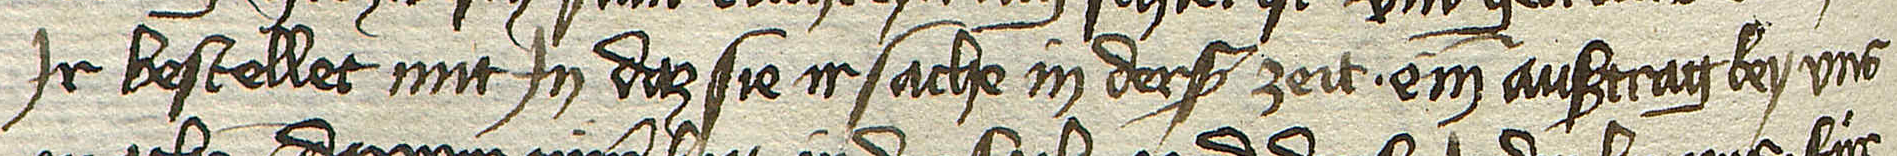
Ir beſtellet mit In daʒ ſie ir ſache in derſ* ʒeit . ein* auſʒtrag bey vns
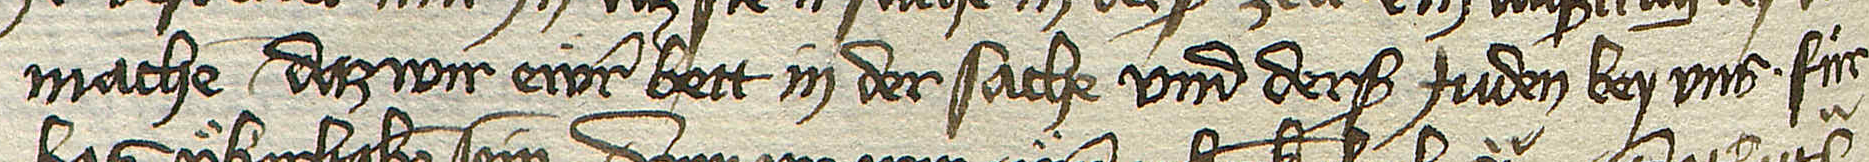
mache* / daʒ wir eẅr* bett in der ſache vnd derſ* Iuden bey vns . für
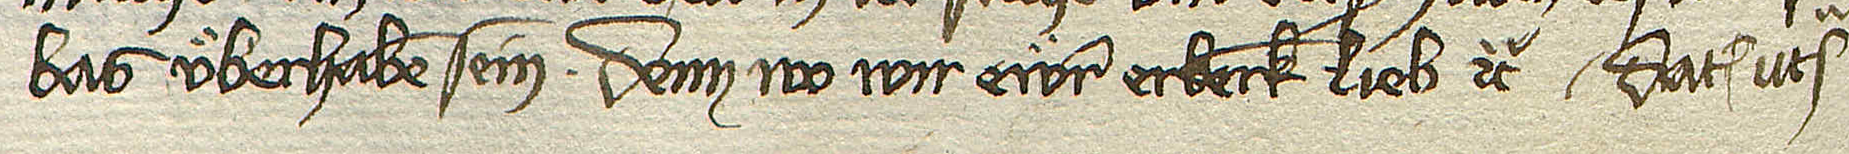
bas v̈berhabe* ſein . Denn wo wir eẅr* erberk* lieb ec* / Dat* ut ſ*
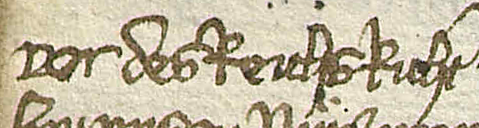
vor des Reichs Richt*
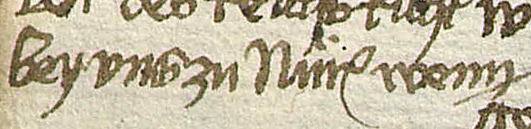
bey vns ʒu Nür* wenn
